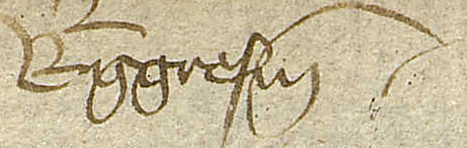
B*ggrefin /
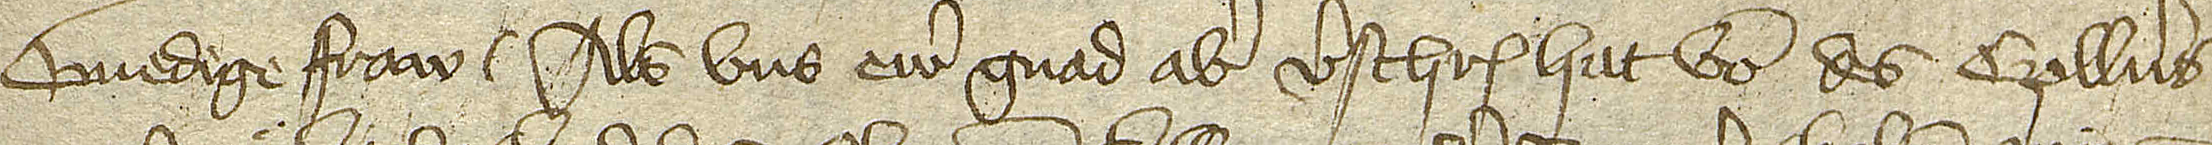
Gnedige fraw / Als vns ew* gnad ab* v*ſchr* hat vo* des Cʒolln*s
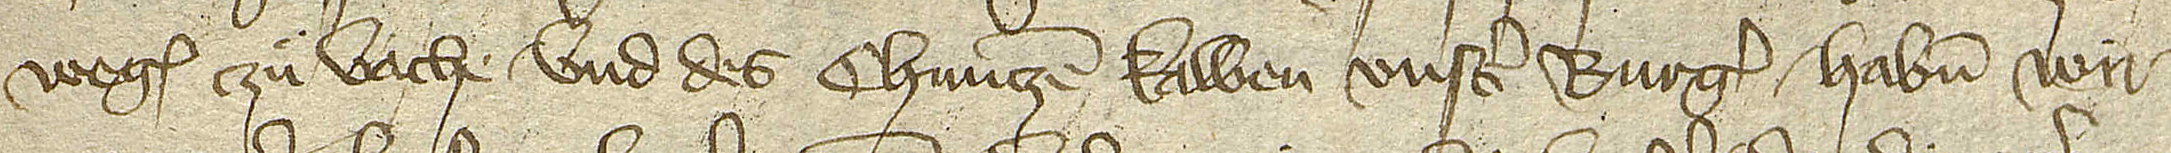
weg* cʒü vache / vnd des Chuncʒe* kalben vnſs* Burg* / habn* wir
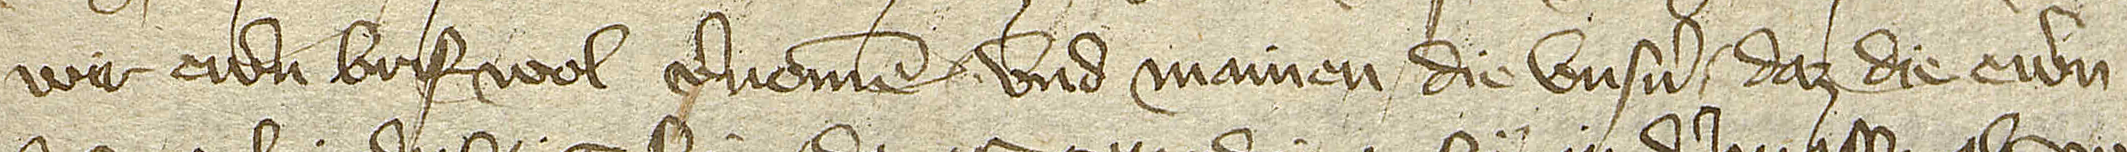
wir ewn* brif wol v*nome* / . vnd mainen / die vnſn* / daʒ die ew*n
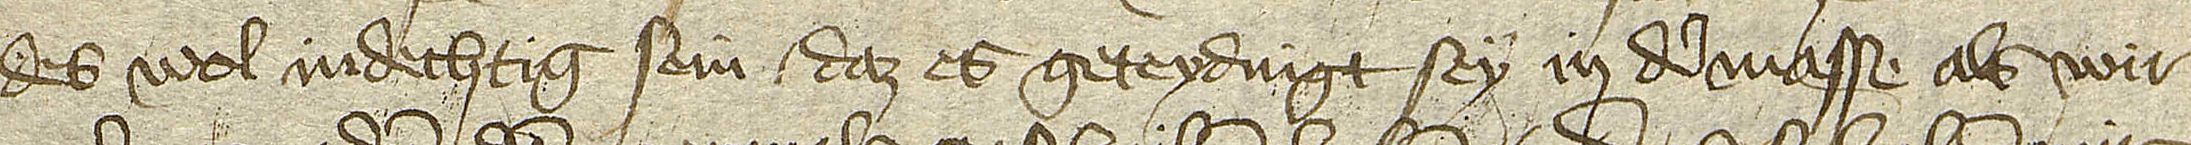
des wol indechtig ſein / daʒ es geteydingt ſey in d* maſſe als wir
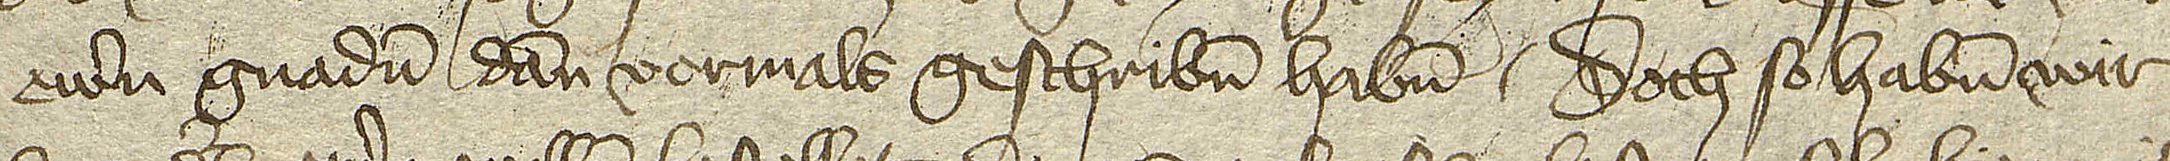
ew*n gnadn* dan* vormals geſchribn* habn* / Doch ſo habn* wir
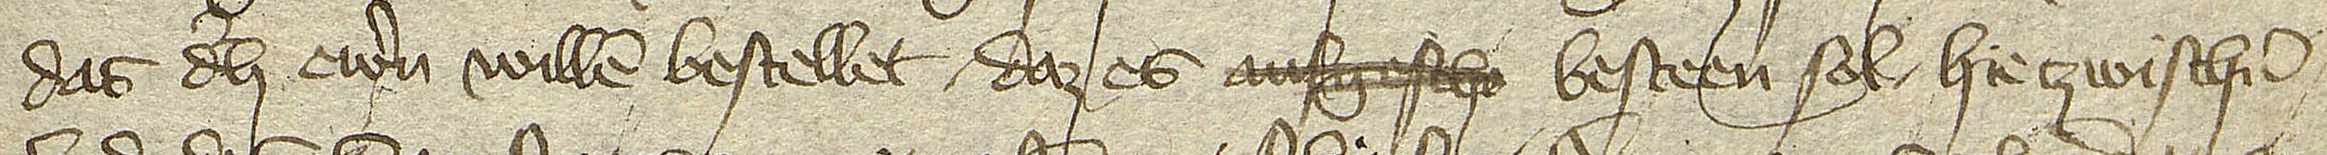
das d*h ew*n wille* beſtellet / daʒ es aufgeſch beſteen ſol / hie cʒwiſchn*
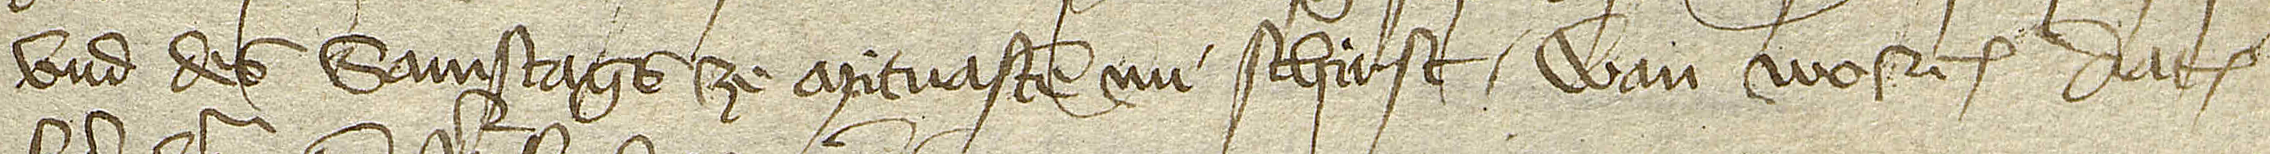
vnd des Samſtags cʒe Mituaſte* nu ſchirſt / wan wo ec* dat*
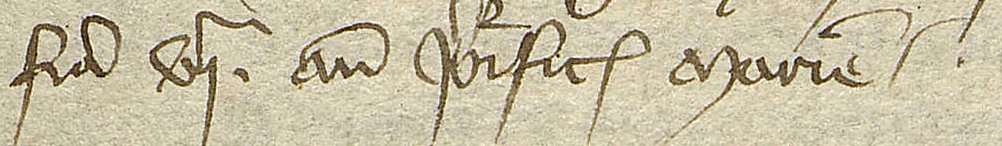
fia* vi* . an* p*rfic* Marie / .
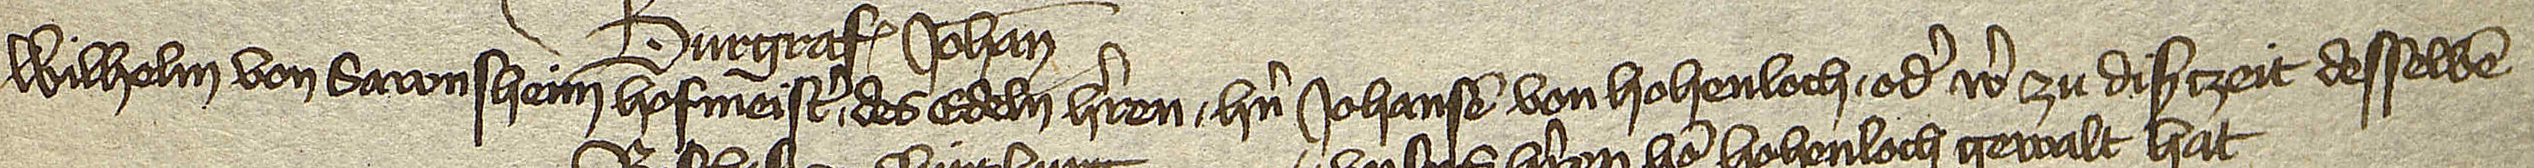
Wilhelm von Sawnſheim hofmeiſt* des Edeln h*ren / hn* Iohanſe* von hohenloch / od* w* cʒu diſ* cʒeit deſſelbe*
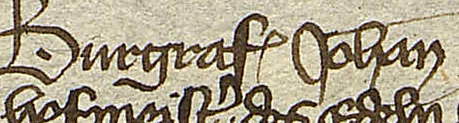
Burgraf* Iohan*
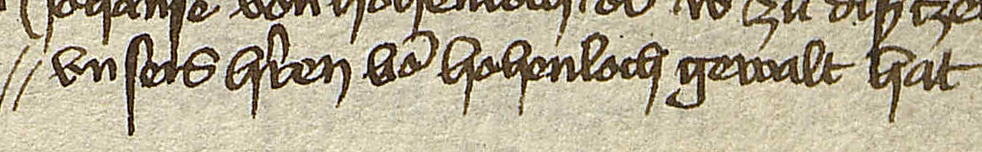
// vnſers h*ren vo* hohenloch gewalt hat
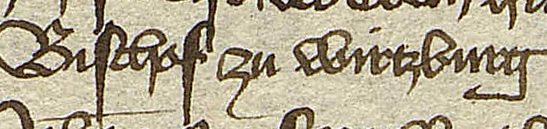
Biſchof cʒu wirtʒburg
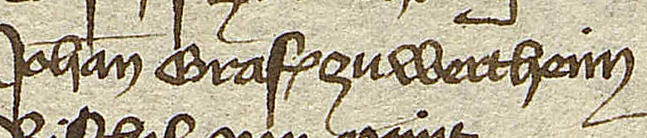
Iohan* Graf* cʒu wertheim
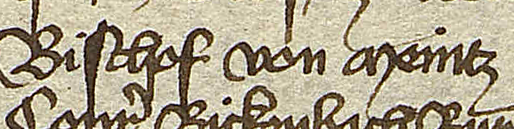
Biſchof von Meintʒ
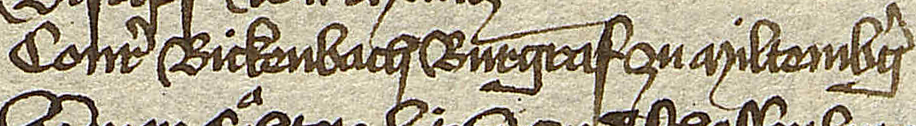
Conr* Birkenbach Burgraf cʒu Miltembg*
